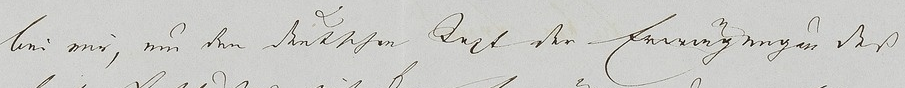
bei mir, um den deutschen Text der Erwägungen deß
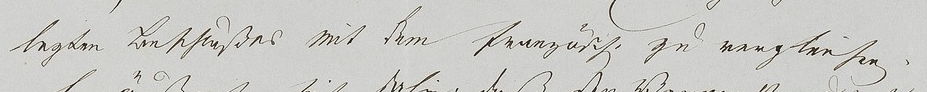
lezten Beschlußes mit dem französch. zu vergleichen.
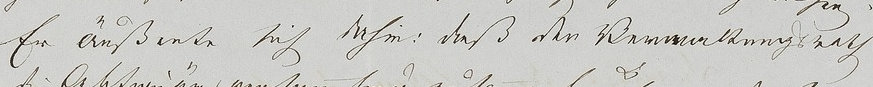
Er äußerte sich dahin: daß der Verwaltungsrath
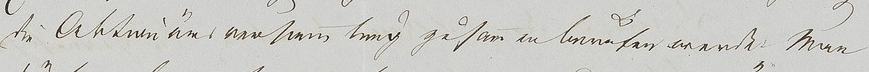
die Aktionärsversammlung zusammenberufen werde. «Man
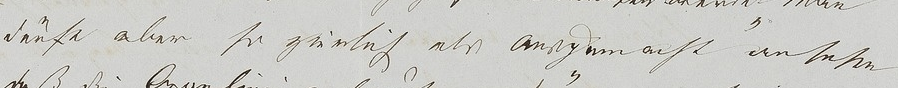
dürfe aber so ziemlich als ausgemacht ansehen
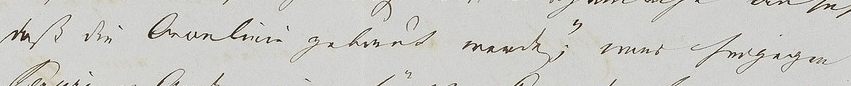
daß die Oronlinie gebaut werde»; was hingegen
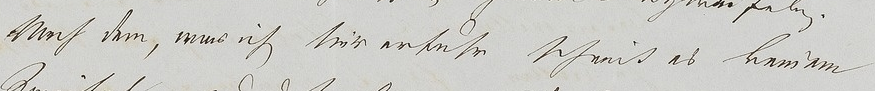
Nach dem, was ich hier erfuhr scheint es keinem
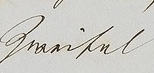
Zweifel
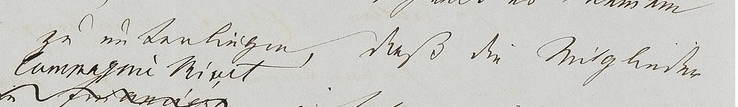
zu unterliegen, daß die Mitglieder
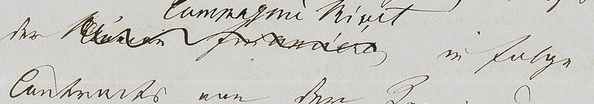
der Réunion financiére Compagnie Rivet in Folge
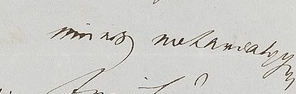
eines notariatischen
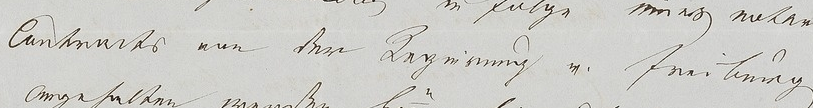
Contracts von der Regierung v. Freiburg
